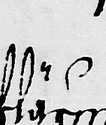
len
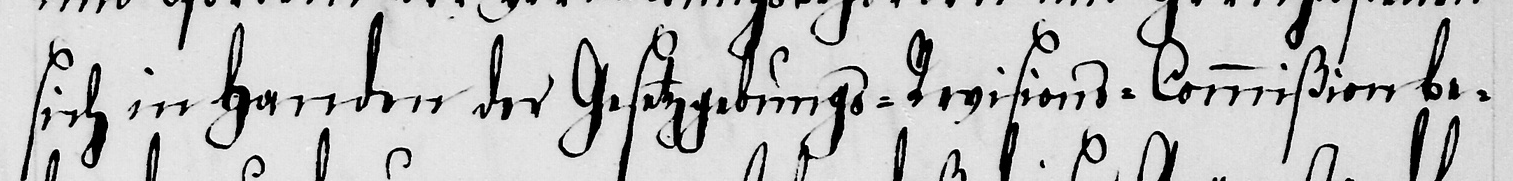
sich in Handen der Gesetzgebungs-Revisions-Commißion be¬
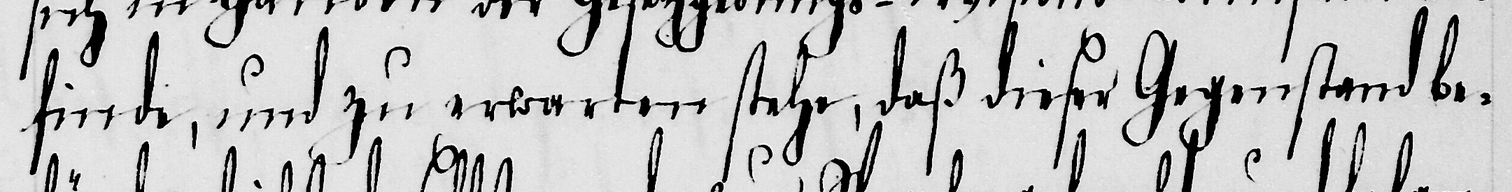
finde, und zu erwarten stehe, daß dieser Gegenstand be¬
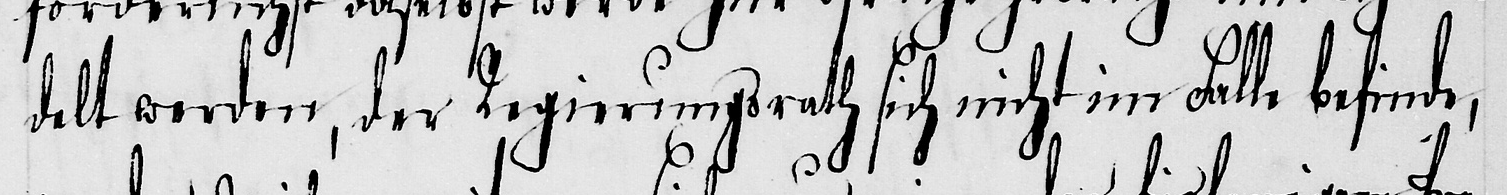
delt werden, der Regierungsrath sich nicht im Falle befinde,
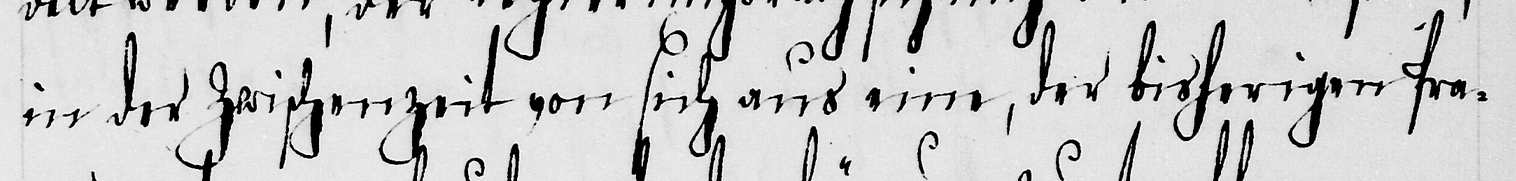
in der Zwischenzeit von sich aus eine, der bisherigen Pra¬
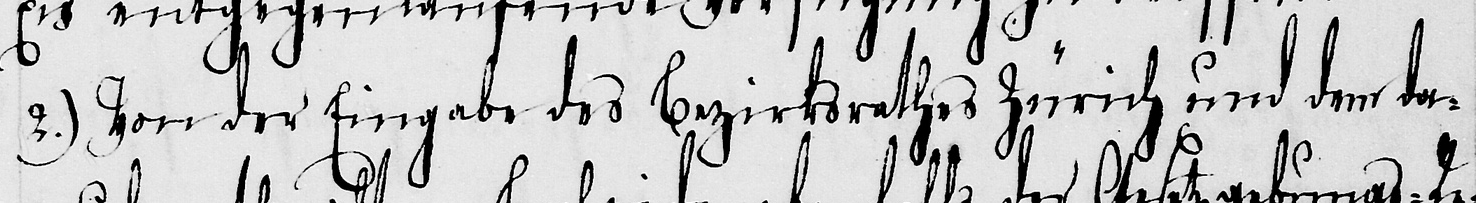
2.) Von der Eingabe des Bezirksrathes Zürich und dem da¬
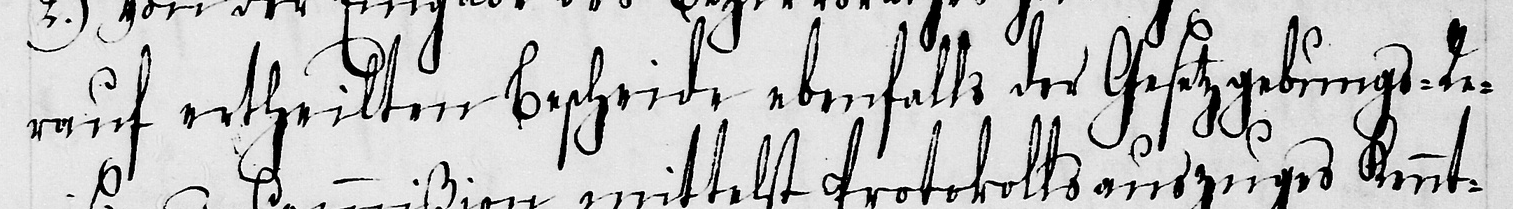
rauf ertheilten Bescheide ebenfalls der Gesetzgebungs-Re¬
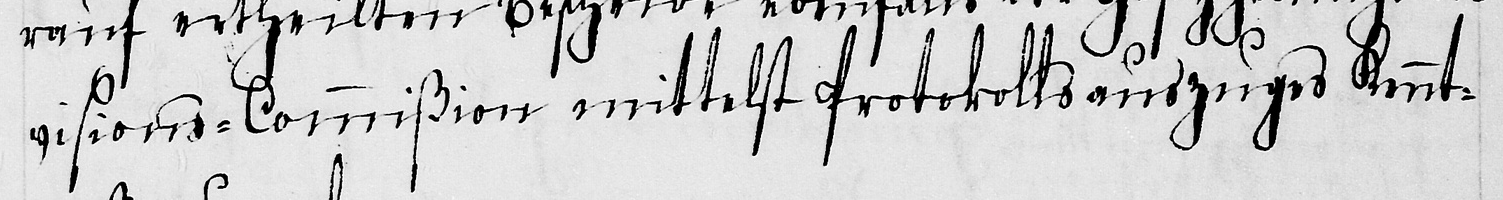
visions-Commißion mittelst Protokollsauszuges Kennt¬
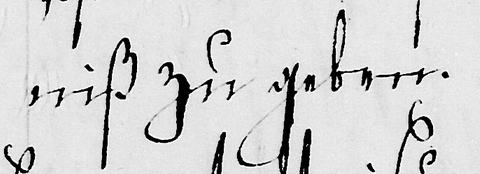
niß zu geben.
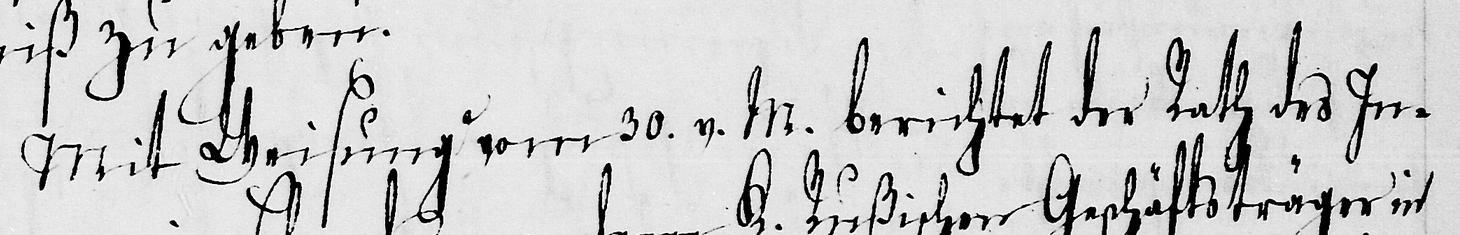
Mit Weisung vom 30. v. M. berichtet der Rath des In¬
